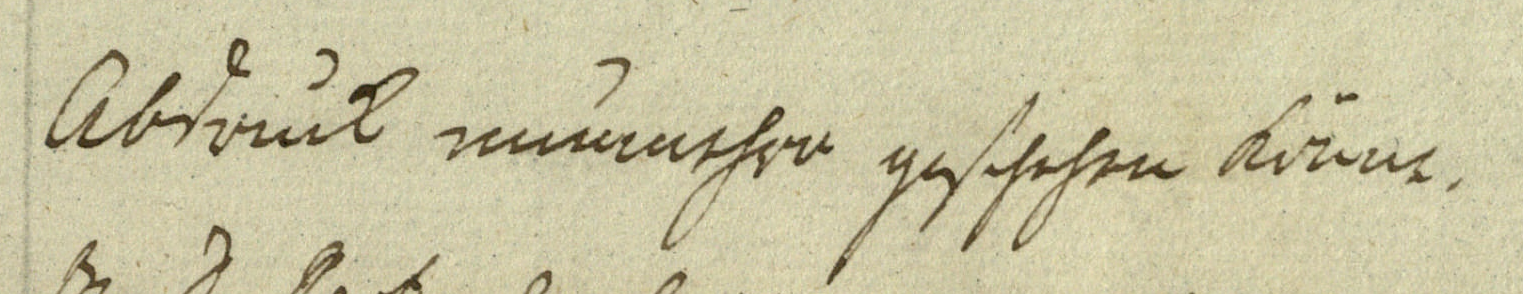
Abdruck nunmehro geschehen könne.
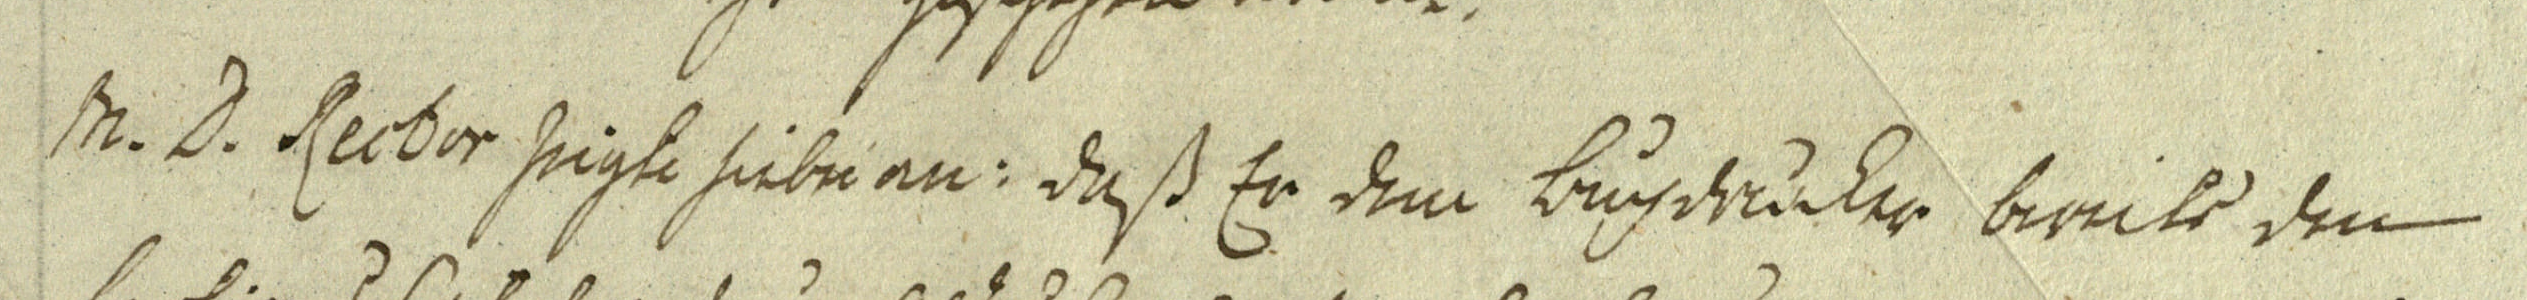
M. D. Rector zeigte hiebei an: daß Er dem Buchdrucker bereits den
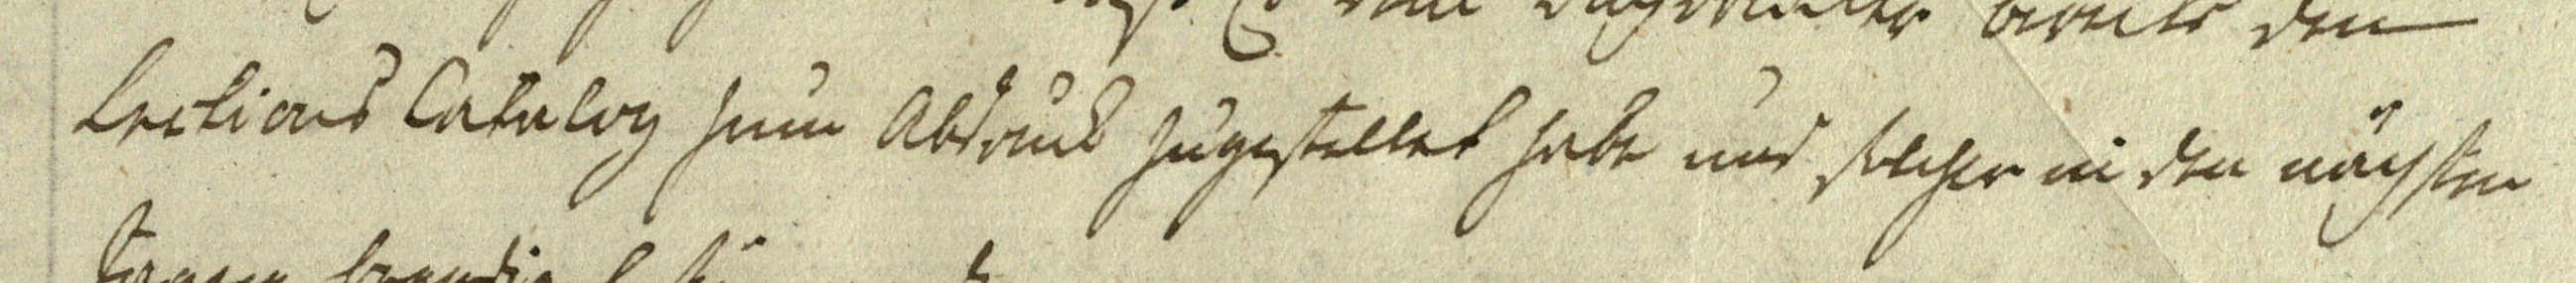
Lections Catalog zum Abdruck zugestellet habe und solcher in den nächsten
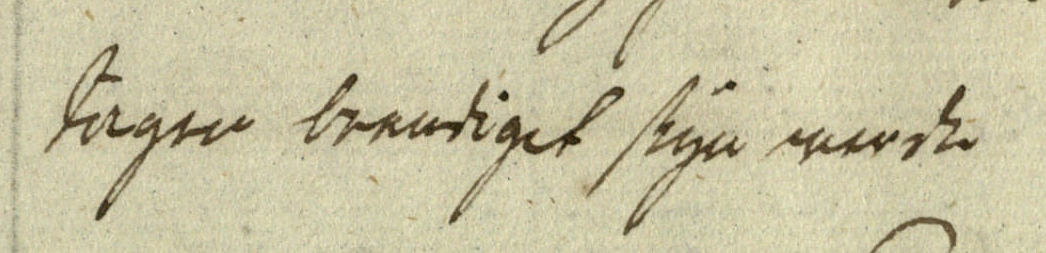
Tagen beendiget seÿn werde.
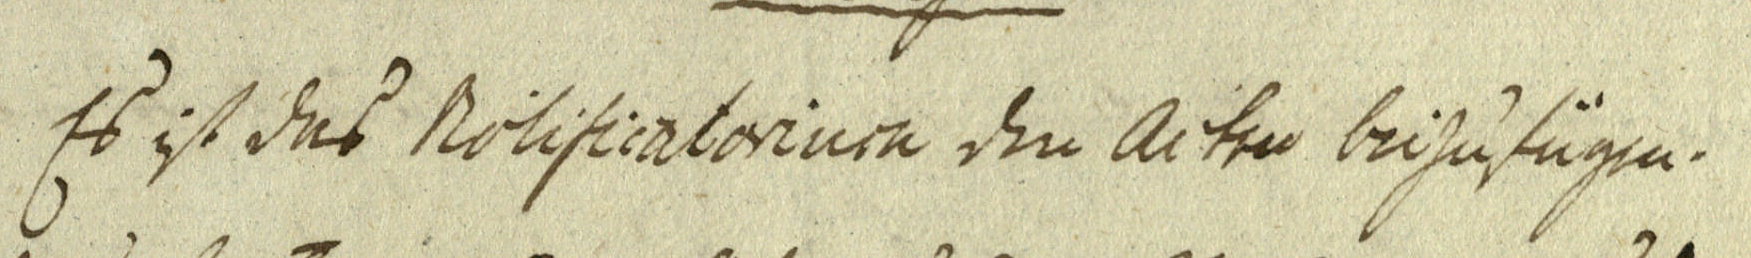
Es ist das Notificatorium den Acten beizufügen.
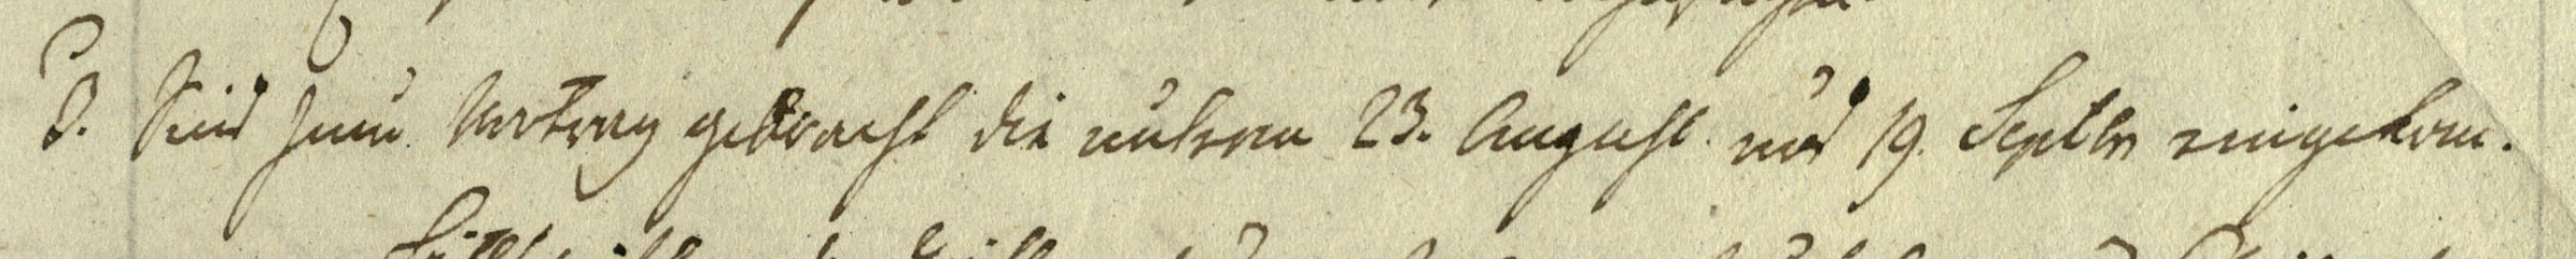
3. Sind zum Vortrag gebracht die unterm 23. August und 19. Septbr. eingekom¬
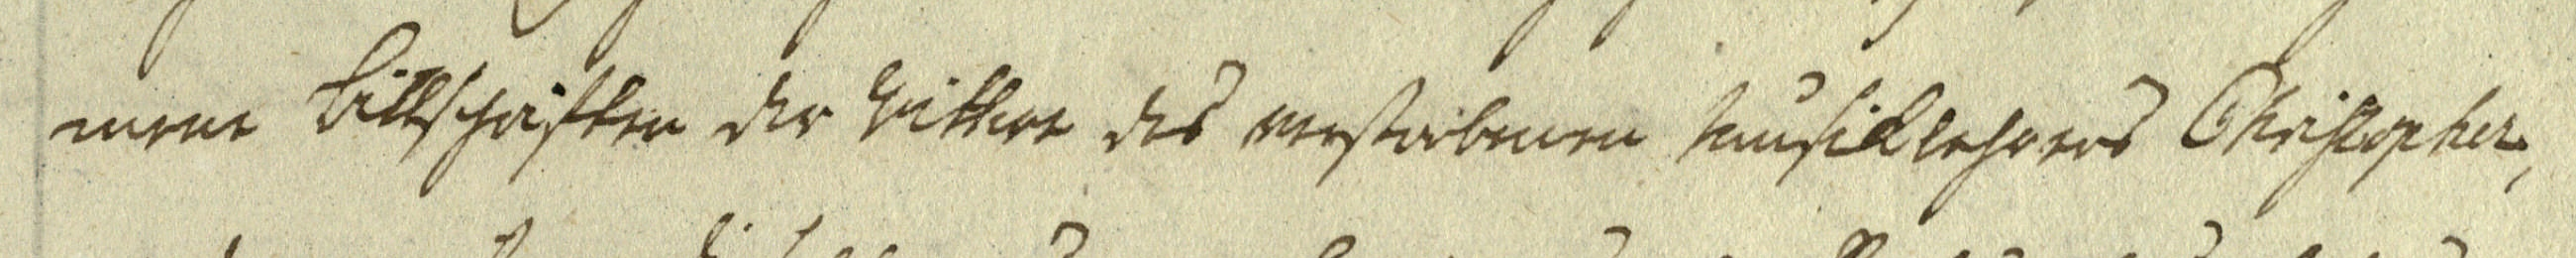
mene Bittschriften der Wittwe des verstorbenen Musiklehrers Christopher,
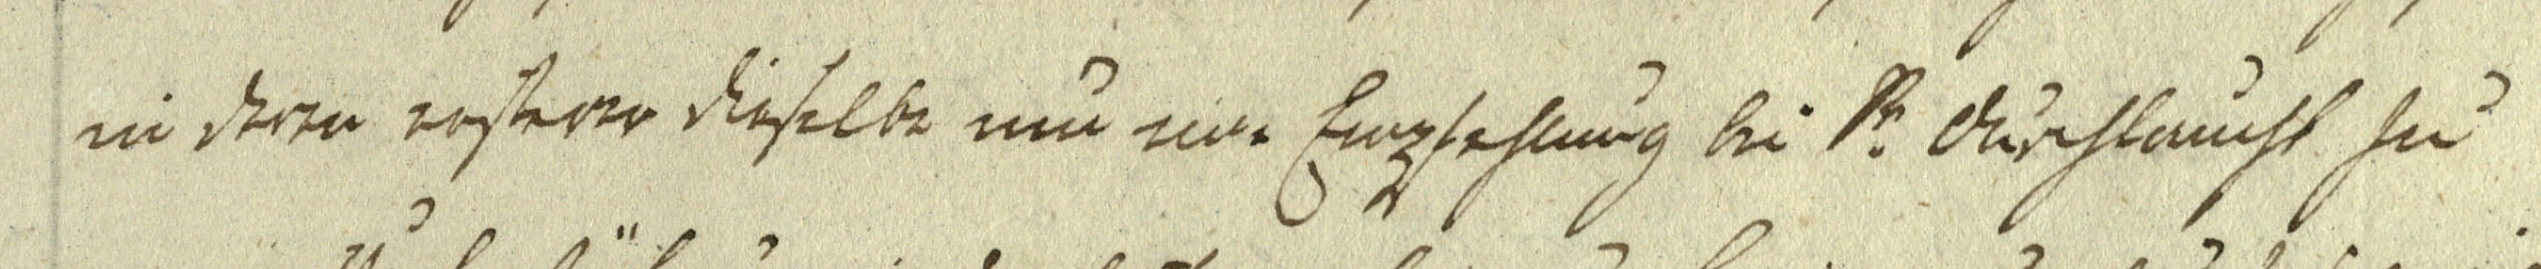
in deren ersterer dieselbe um eine Empfehlung bei Sr Durchlaucht zu
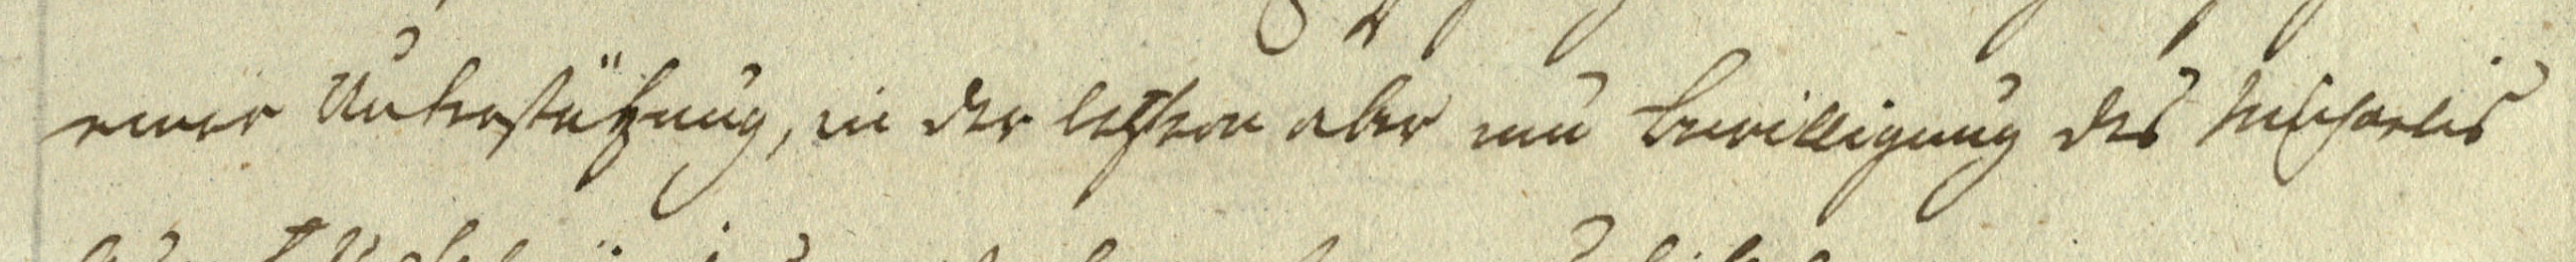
einer Unterstützung, in der letztern aber umBewilligung des Michaelis
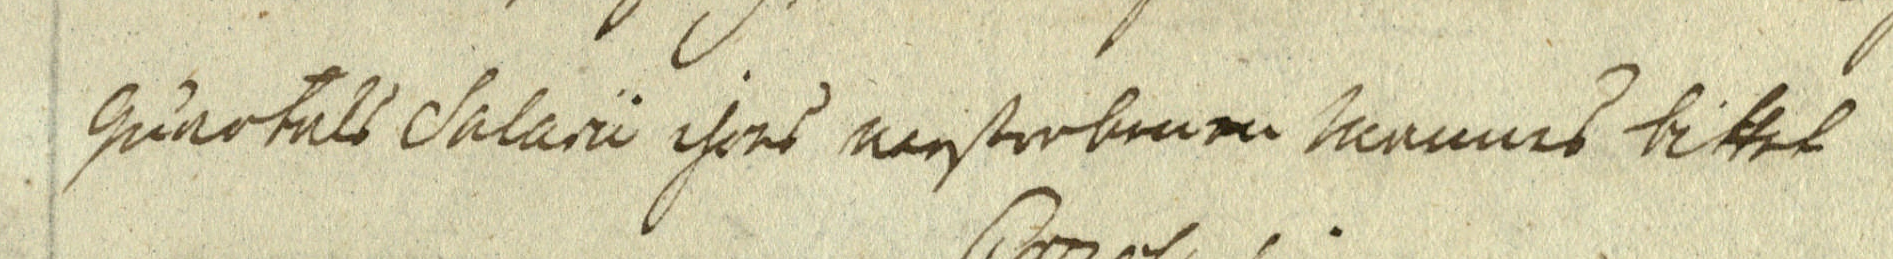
Quartals Salarii ihres verstorbenen Mannes bittet
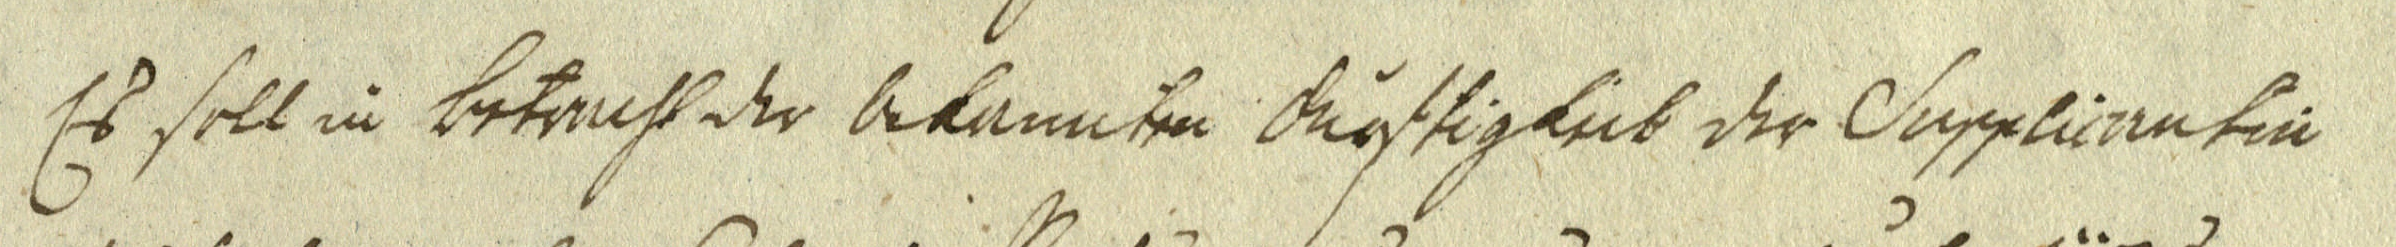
Es soll in Betracht der bekannten Dürftigkeit der Supplicantin
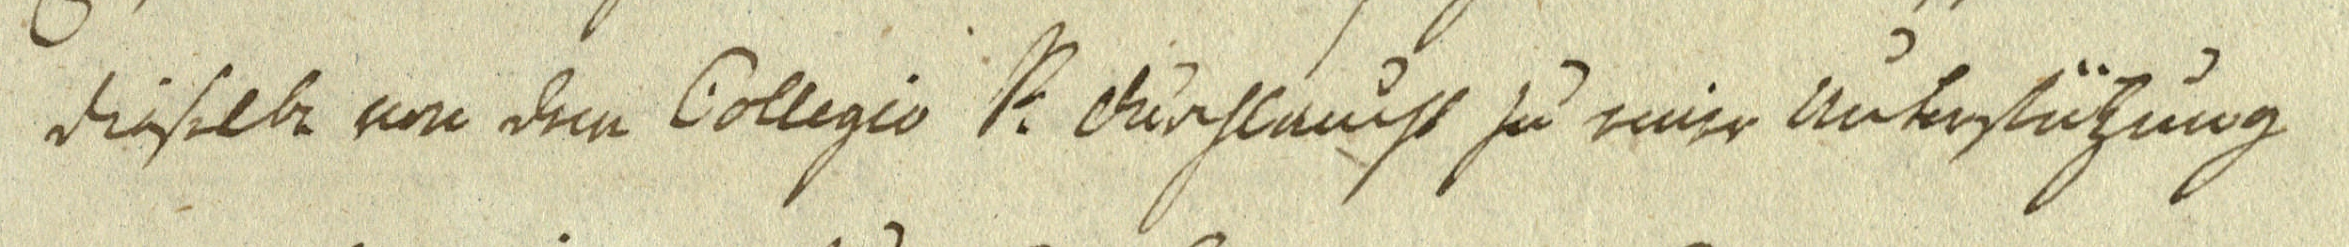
dieselbe von dem Collegio Sr. Durchlaucht zu einer Unterstützung
